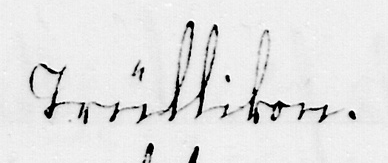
Trüllikon.
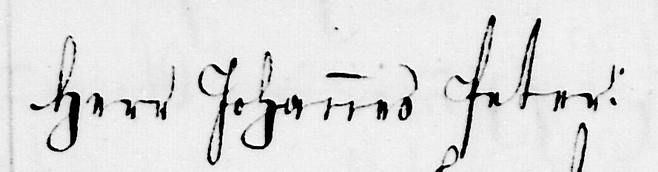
Herr Johannes Peter.
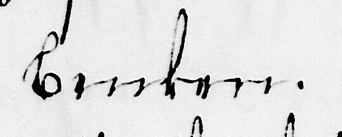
Benken.
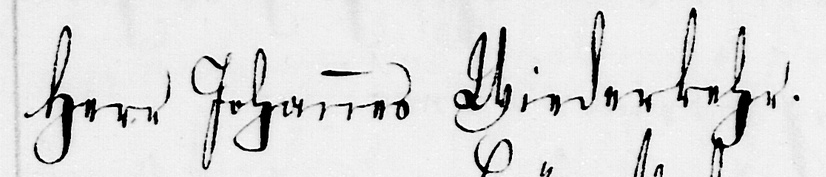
Herr Johannes Wiederkehr.
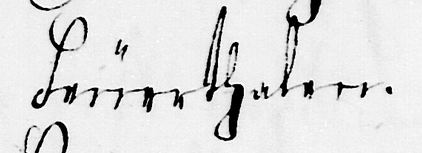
Feuerthalen.
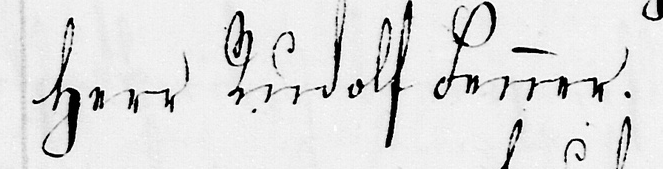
Herr Rudolf Fenner.
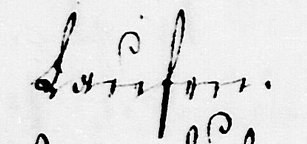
Laufen.
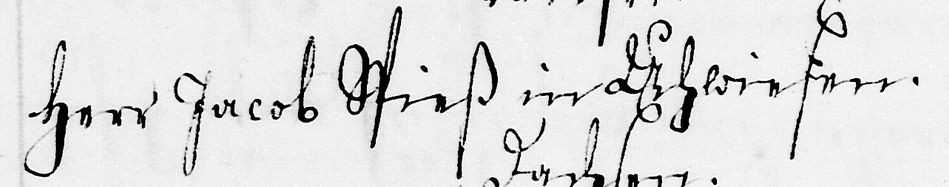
Herr Jacob Spieß in Uhwiesen.
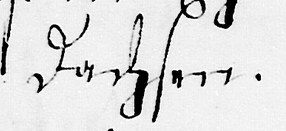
Dachsen.
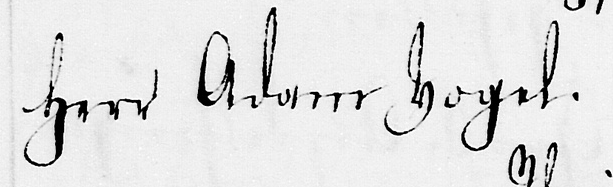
Herr Adam Vogel.
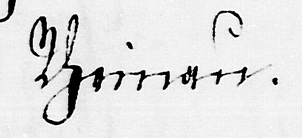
Rheinau.
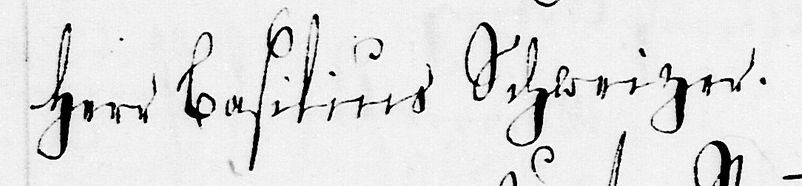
Herr Basilius Schweizer.
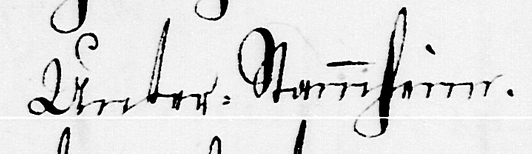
Unter-Stammheim.
